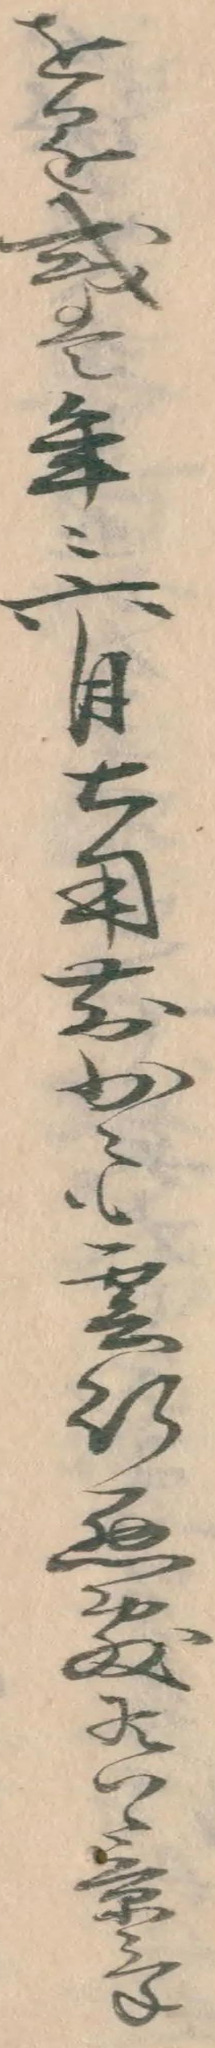を懸或は年々六月土用前少にも雲行悪敷候はゝ景気
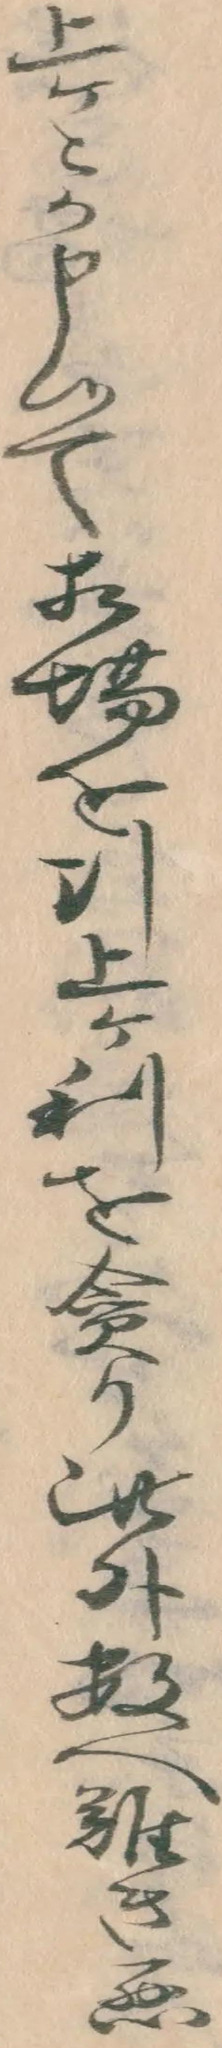上けとか申候て相場を引上け利を貪り此外数へ難き悪
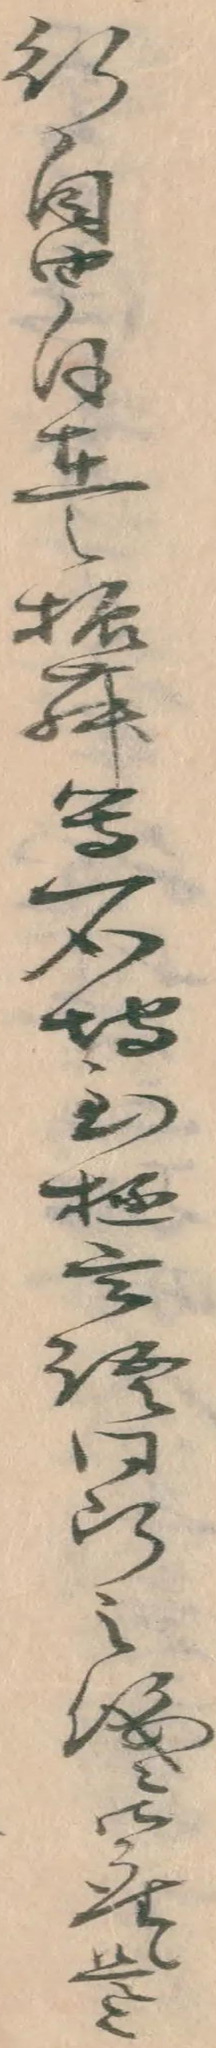行自由自在之振舞等不埒至極言語同断之儀に御座候是々
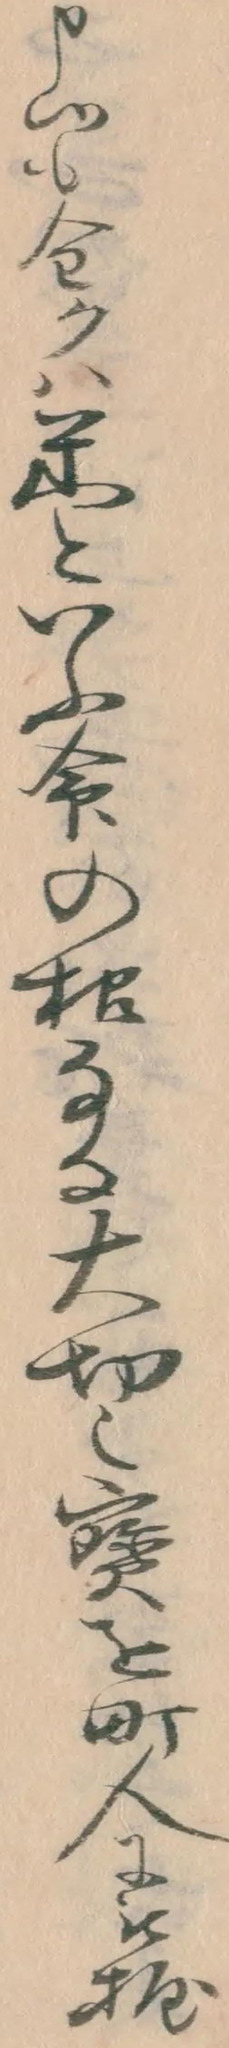申候も全くは米といふ命の根なる大切之宝を町人に被抱
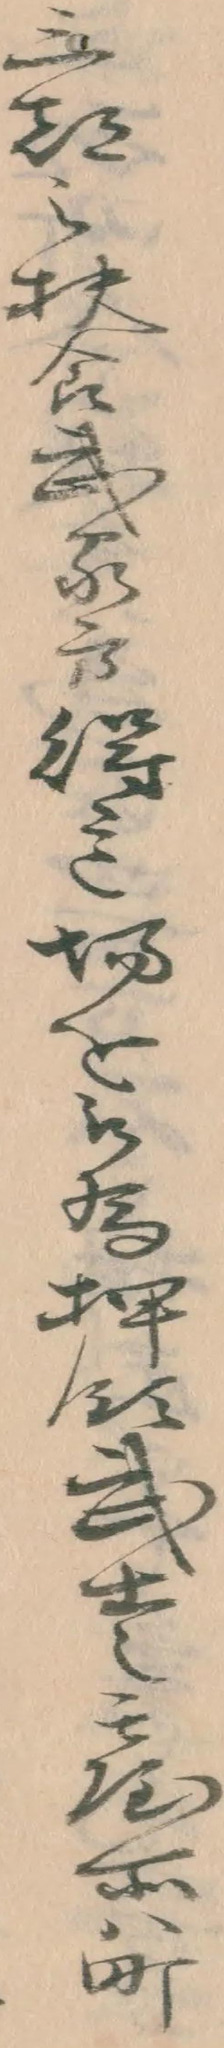三都之扶食武家方得意場を被為押領武士之台所は町
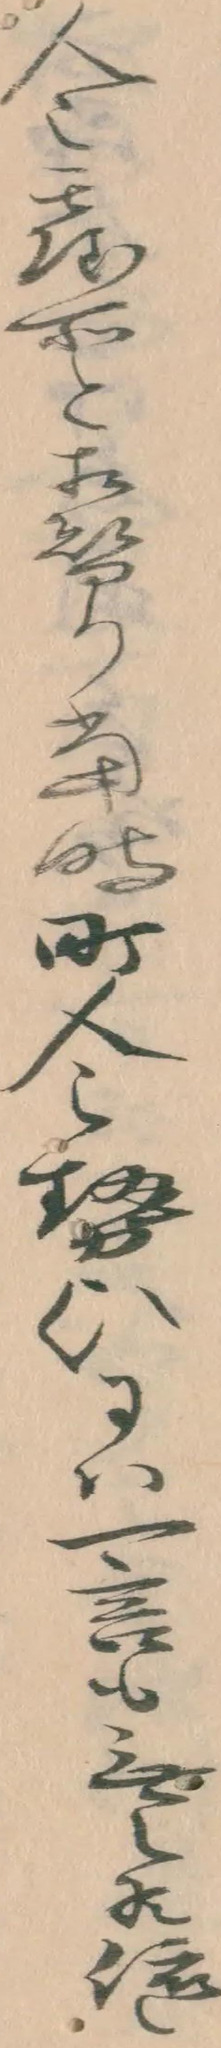人之台所と相替り当時町人之勢ひには一言も無之候依之
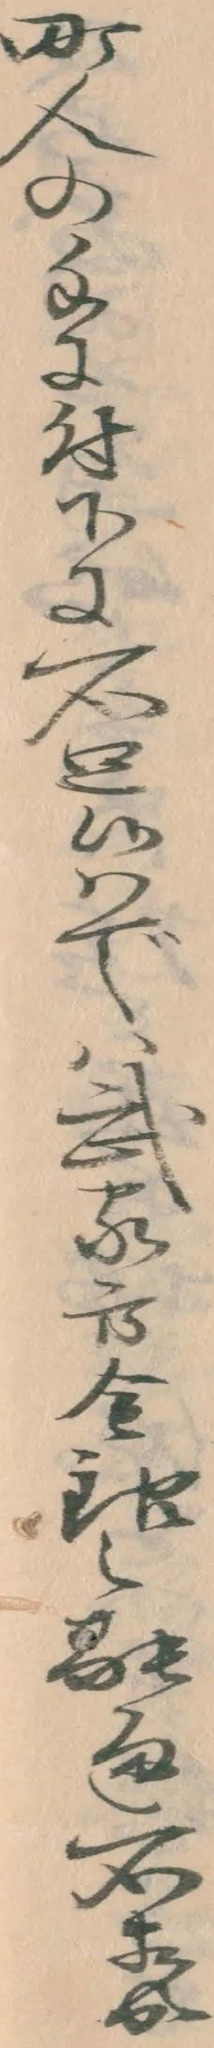町人の手に付下に不廻候はでは武家方金銀之融通不相成
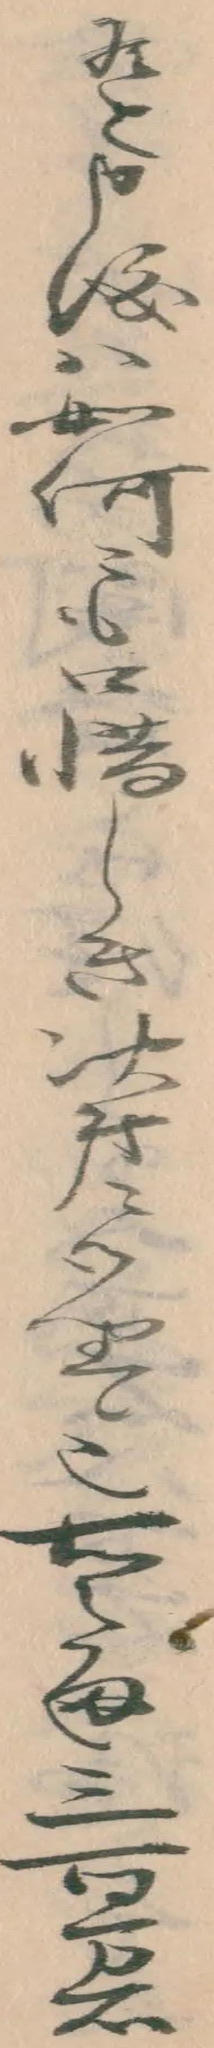候と申儀は如何にも口惜しき次第に御坐候也右之通三百万石
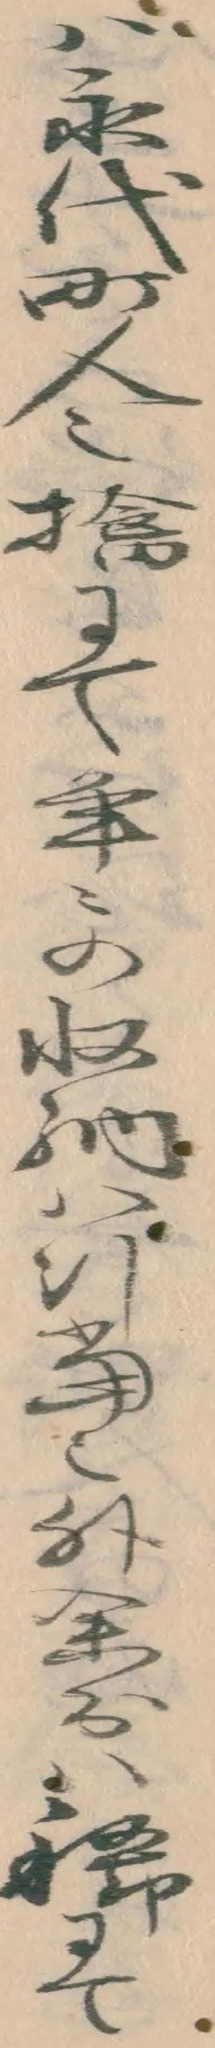は永代町人の擒にて年々の収納は引当之外余分は稀にて
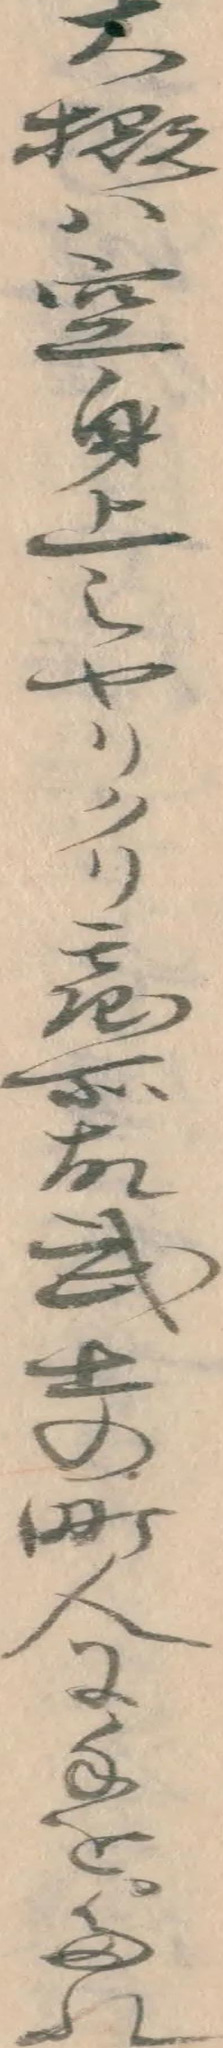大概は空身上之ヤリクリ台所故武士の町人に手を°たれ
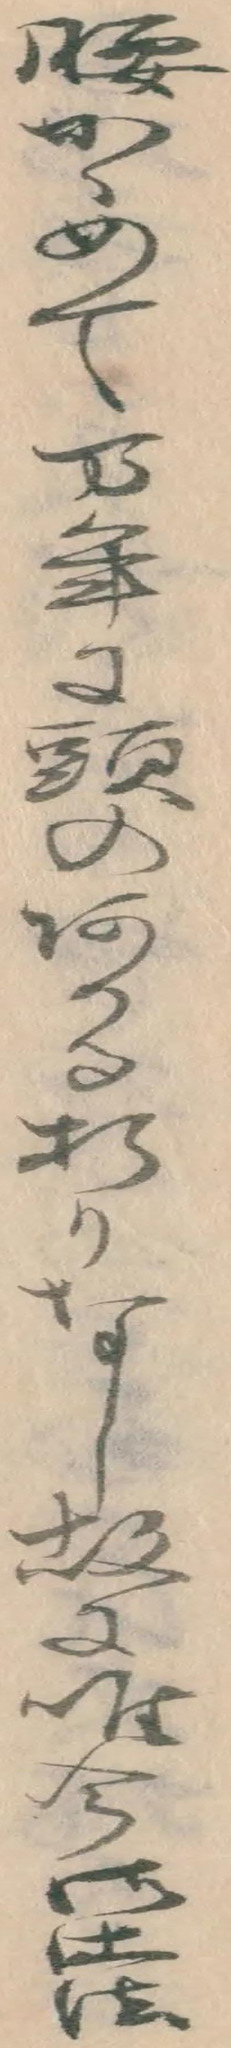腰かゝめて万年に頭のあかる折りなし故に唯今御仕法
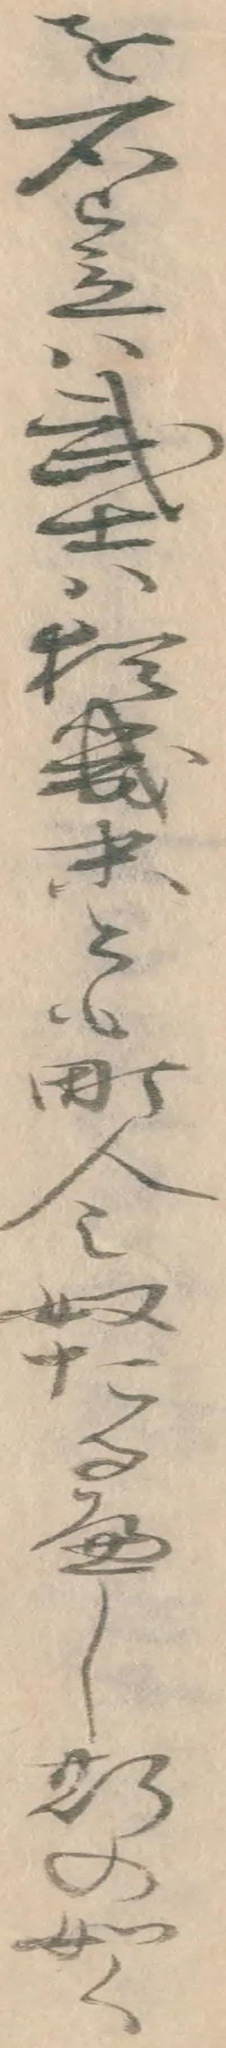を不被立は武士は猶幾末とも町人之奴たるへし斯の如く
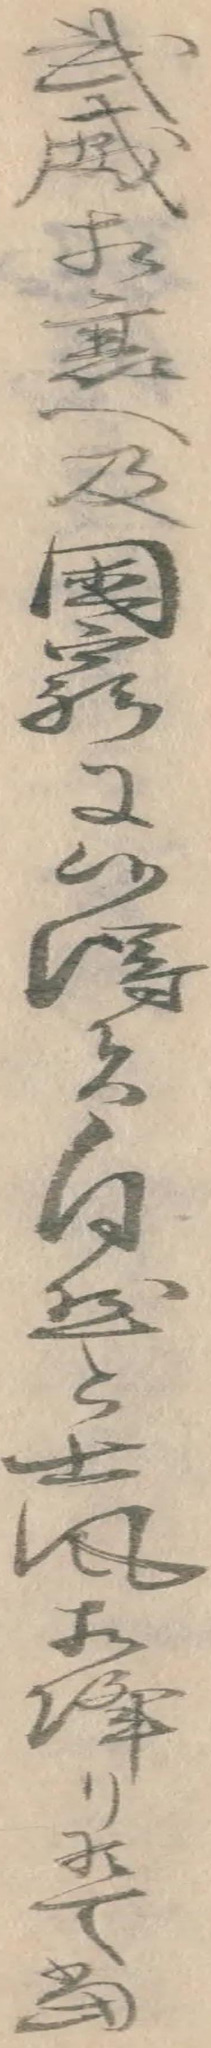武威相衰へ及困窮に候得は自然と士風相降り候て当
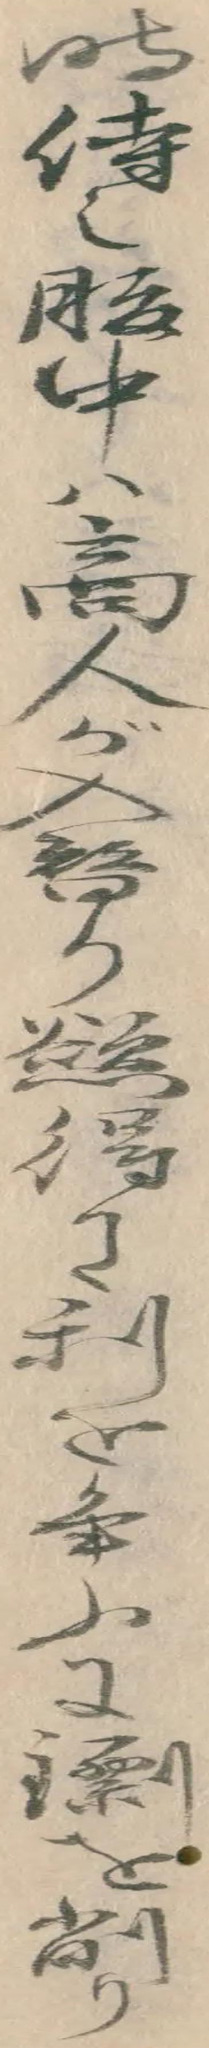時侍之腹中は商人が入替り慾得に利を争ふにを削り
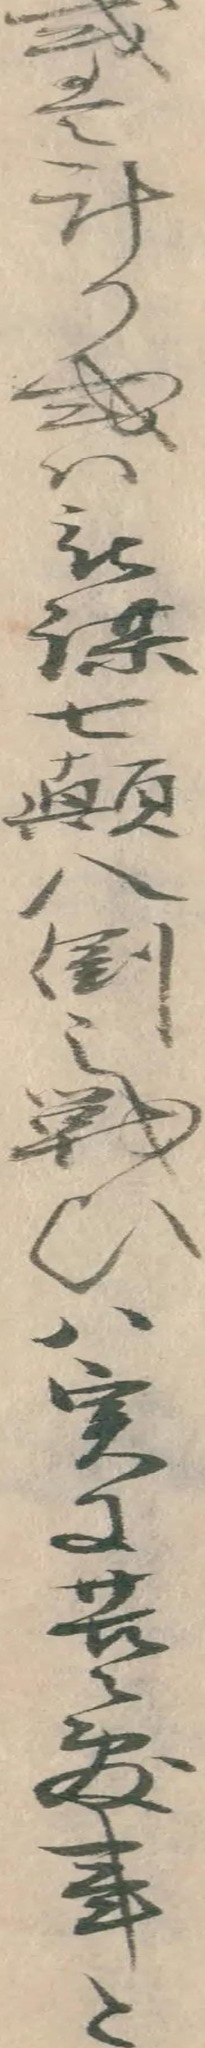或は計り或は被謀七顚八倒之戦ひは実に苦々敷事と
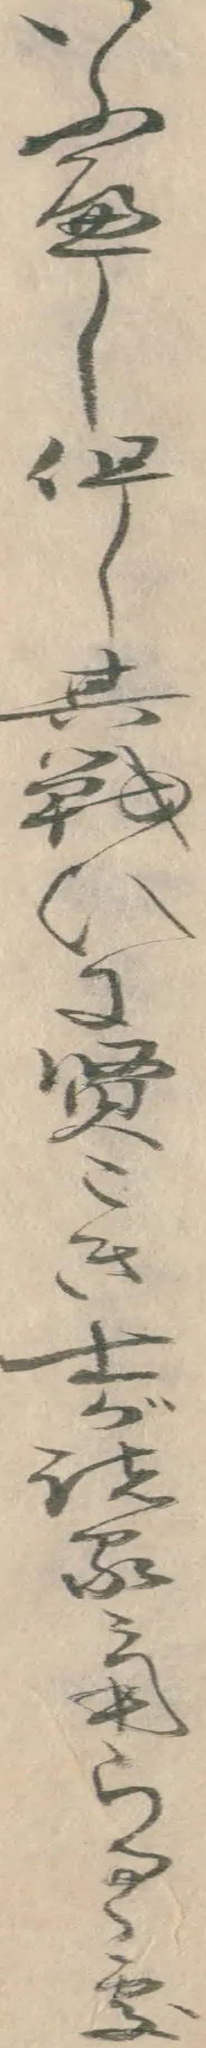いふへし但し其戦ひに賢こき士が諸家に用らるゝ処
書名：斎庭之穂
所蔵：国立国会図書館 National Diet Library, JAPAN
